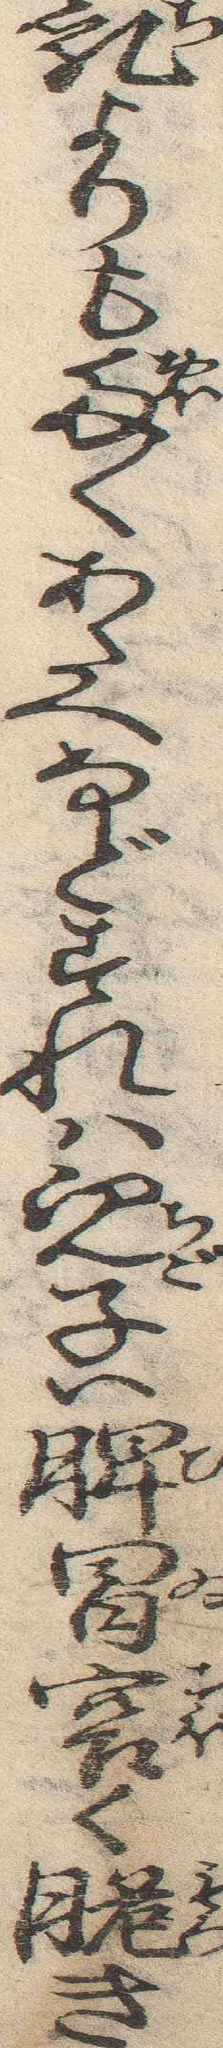乳よりも多くあたへなどすれは児子は脾胃窄く脆き
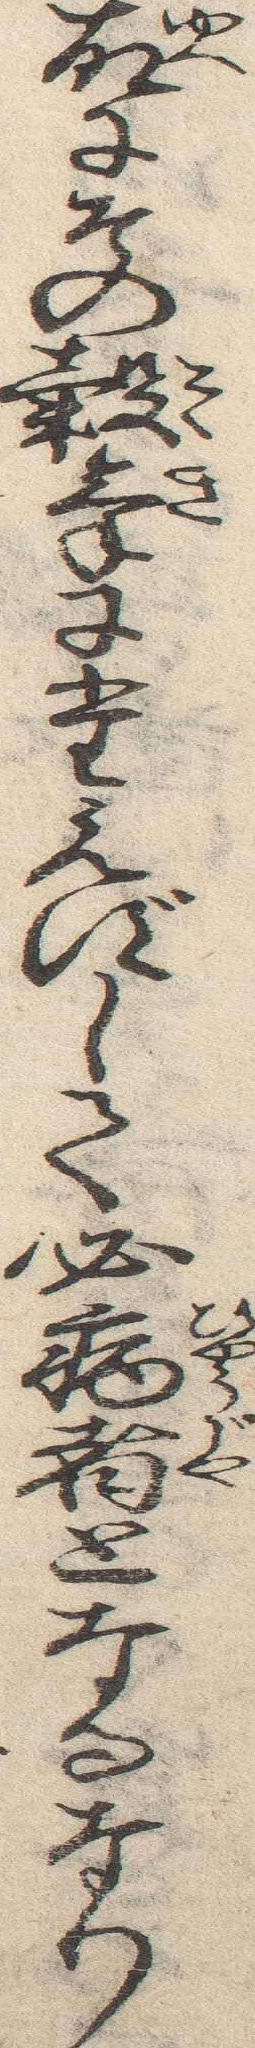故にその穀氣にたえずして必病者となるなり
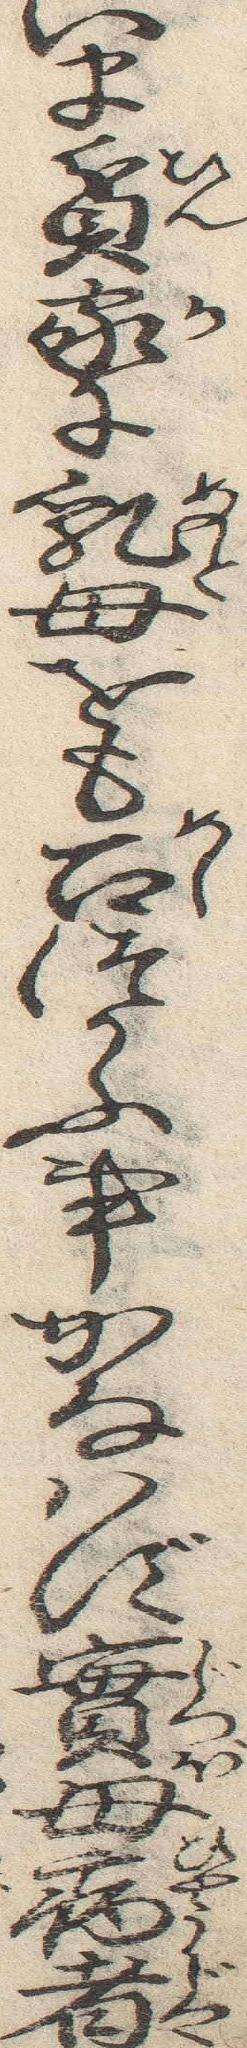いま貧家に乳母をも召つかふ事かなはず實母病者
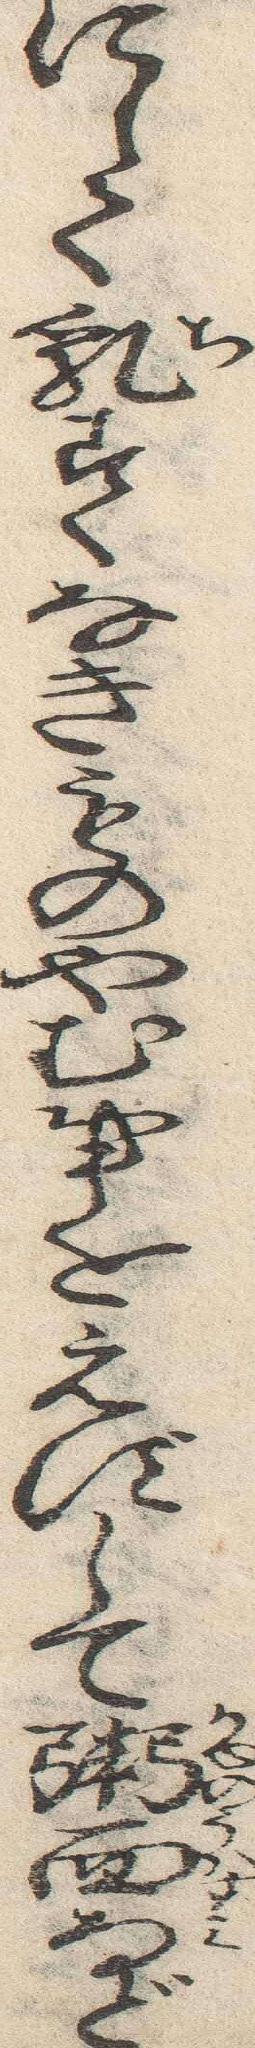にして乳すくなきものやむ事をえずして粥面など
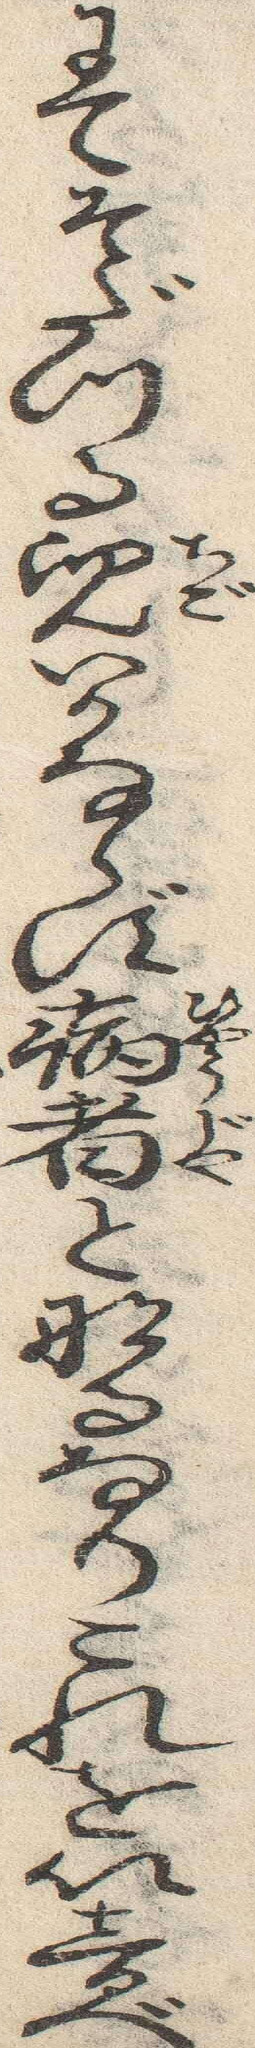にてそだつる児はかならず病者となるなりこれを以しるべ
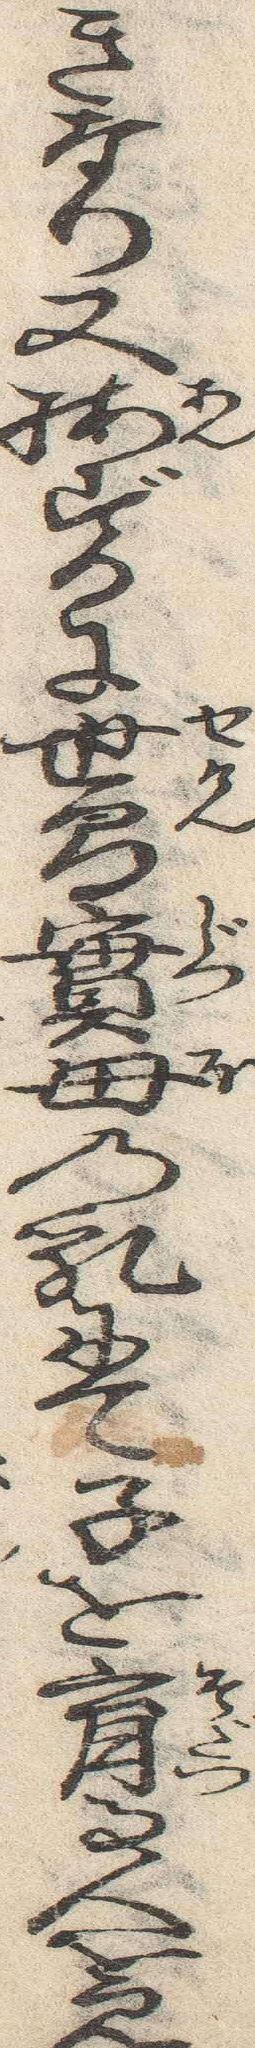きなり又按ずるに世間實母の乳にて子を育る人を見
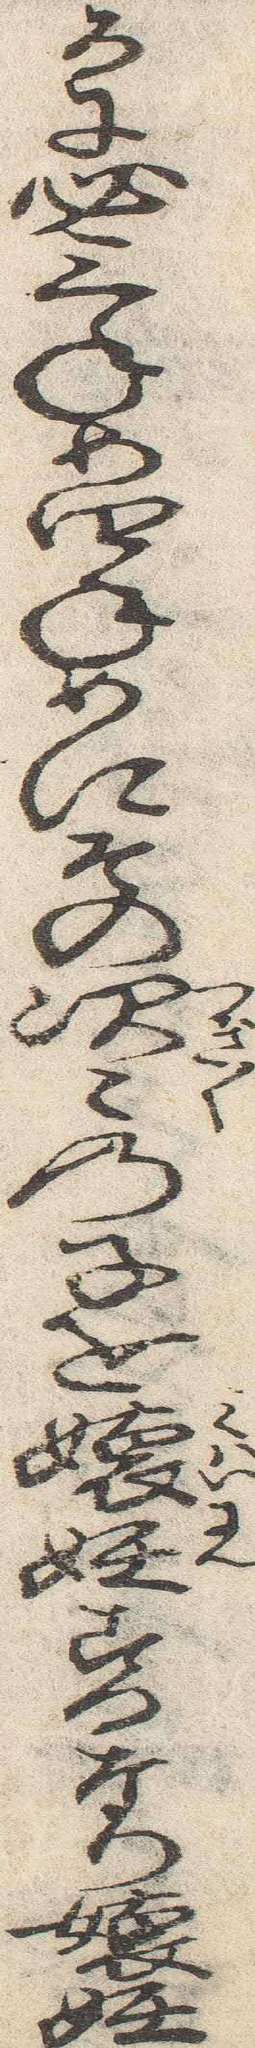るに必三年め四年めにその次〻の子を㜳妊するなり㜳妊
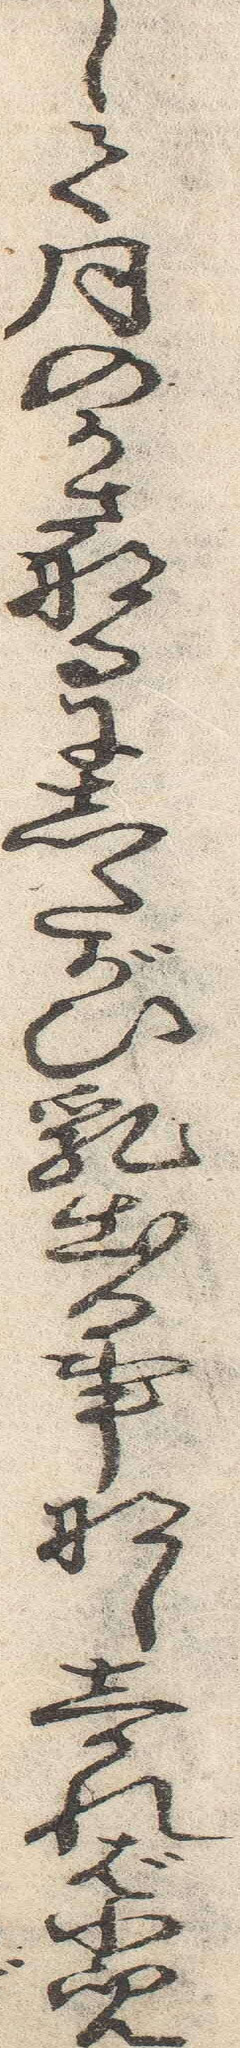して月のかさなるにしたがひ乳出る事なししかれば小児
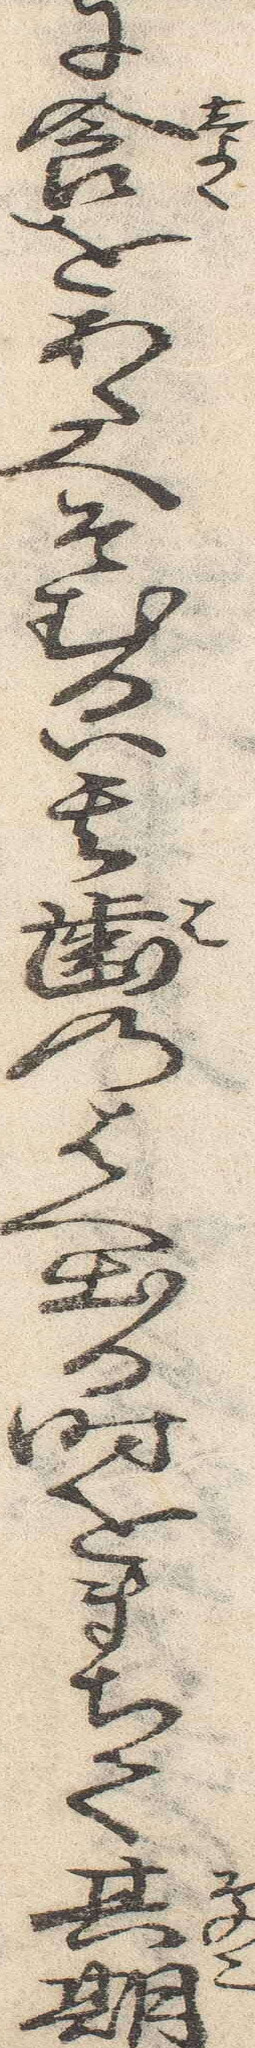に食をあたへそむるは其歯のはへ出る時をまちて其後
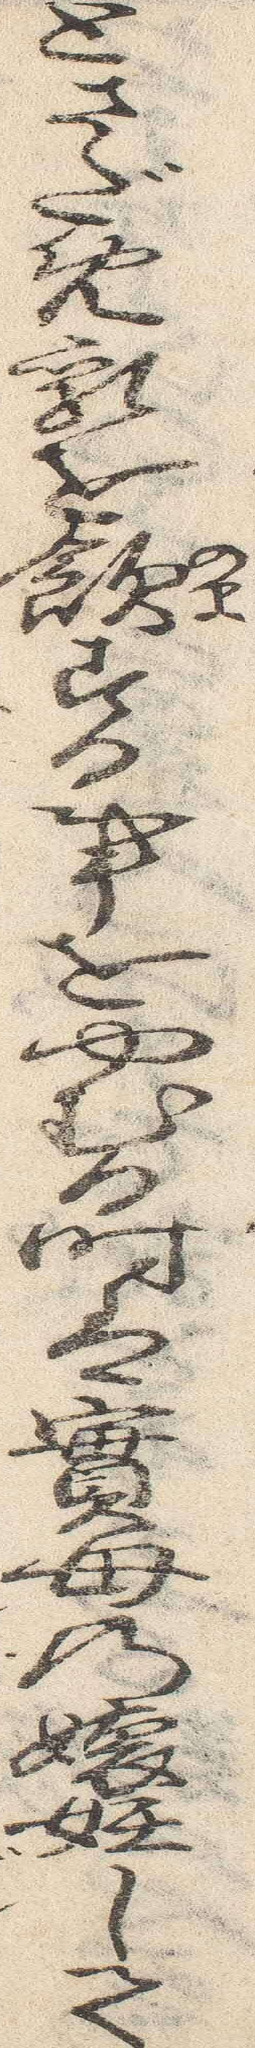とさだめ乳を飲する事をやむる時は實母の㜳妊して
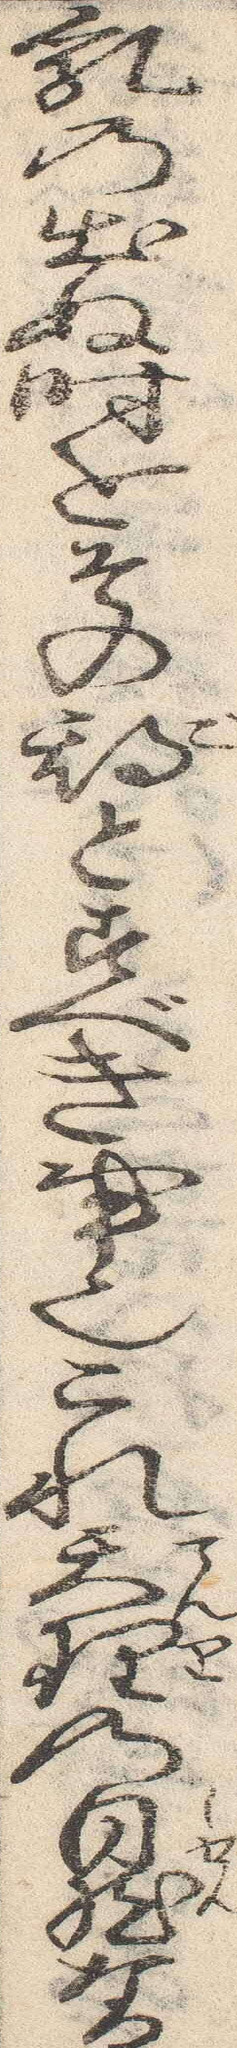乳の出ぬ時をその期とすべき事也これ天理の自然なる
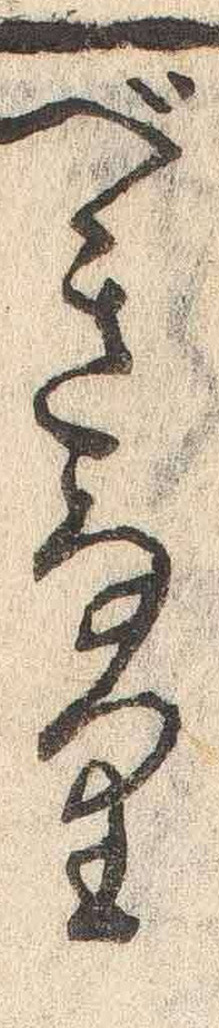べきなり
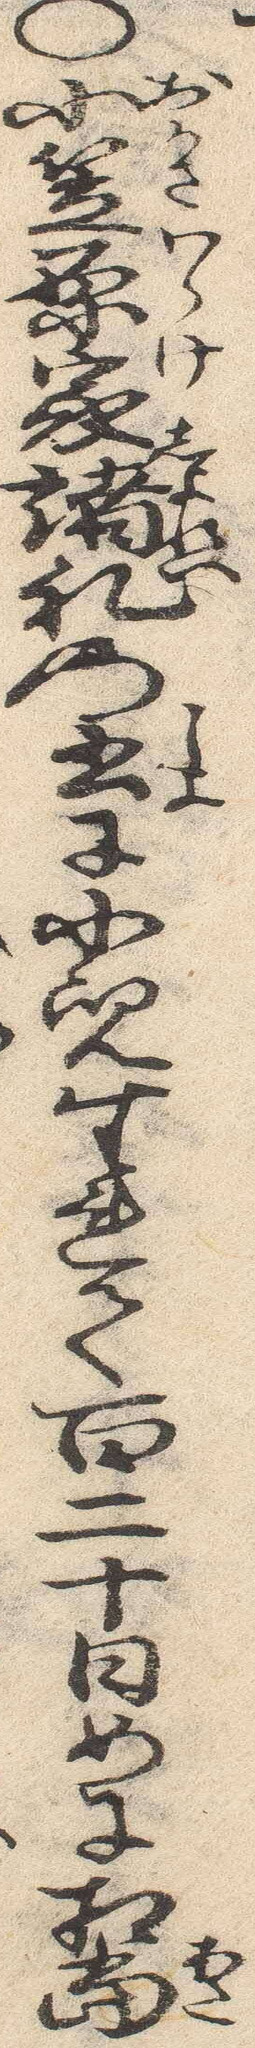◯小笠原家諸礼の書に小児生れて百二十日めに相当
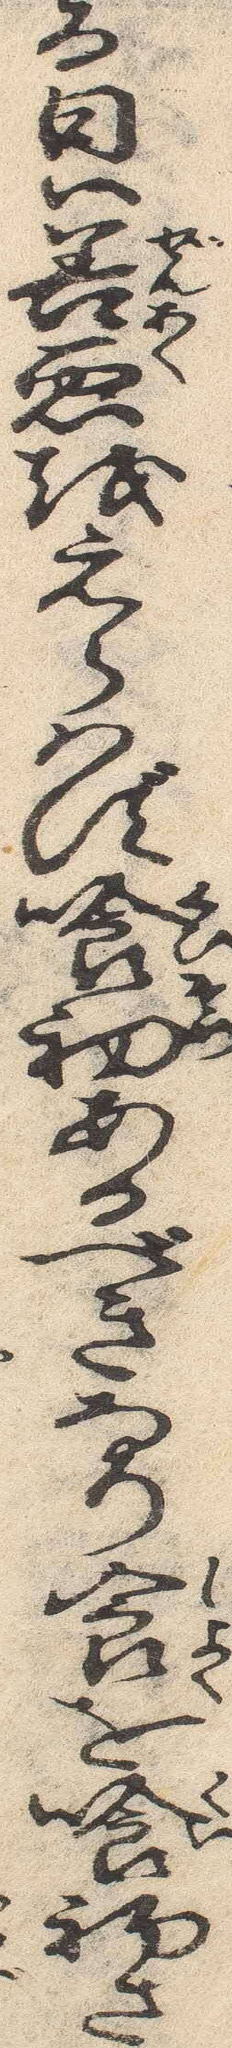る日は善悪をえらはず喰初あるべきなり食を喰初さ
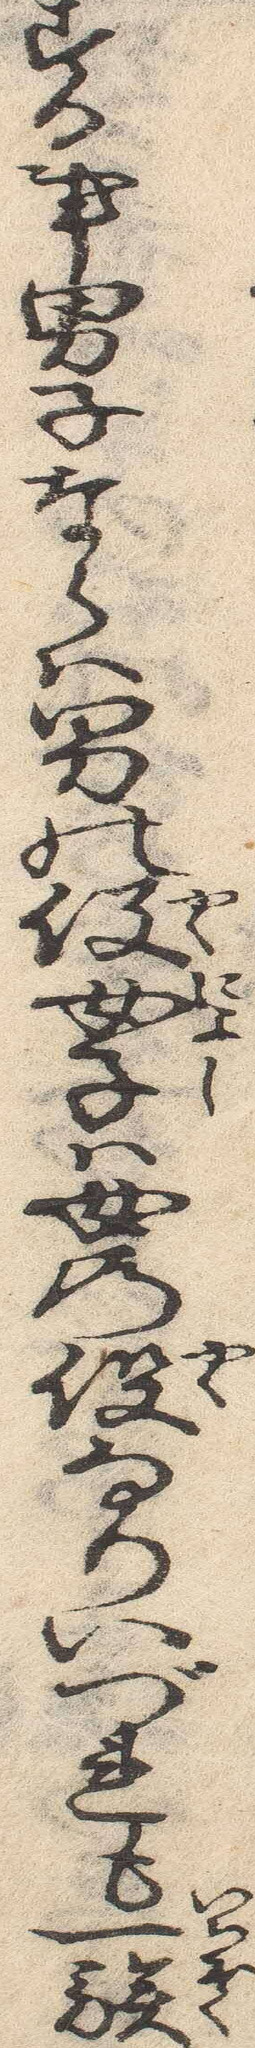する事男子ならは男の役女子は女の役なりいづれも一族
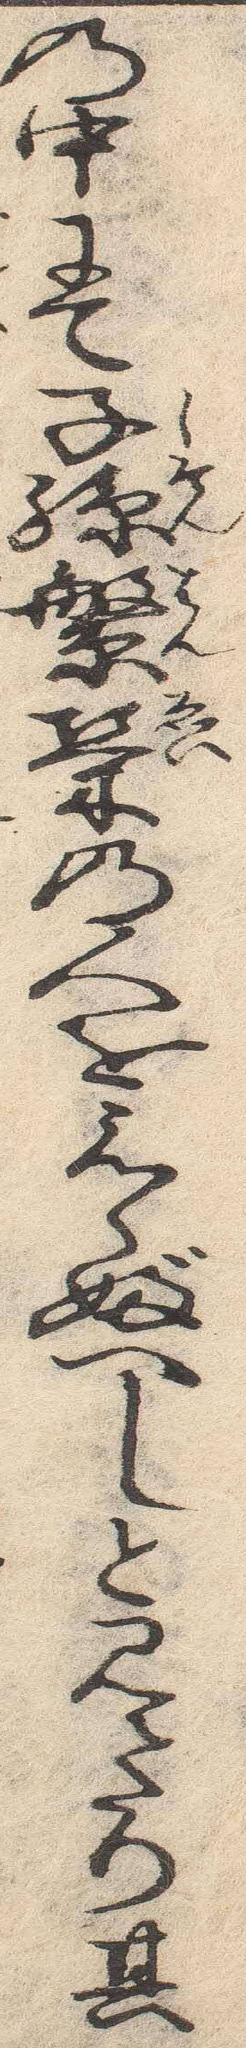の中にて子孫繁栄の人をえらぶへしと見えたり其
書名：小児必用養育草
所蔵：東京学芸大学附属図書館 国文学研究資料館
